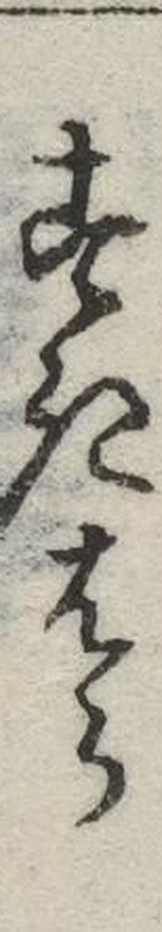すきはら
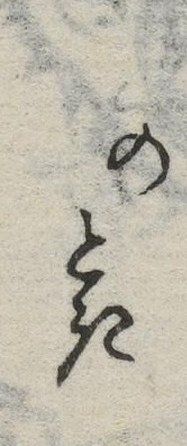のとき
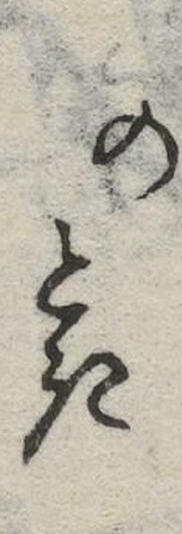のとき
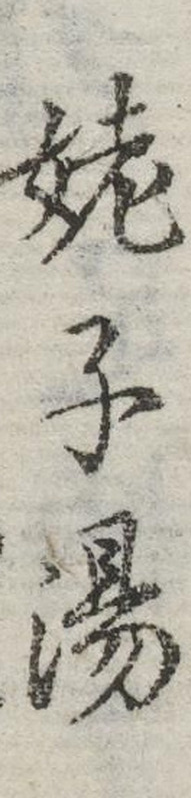姥子湯
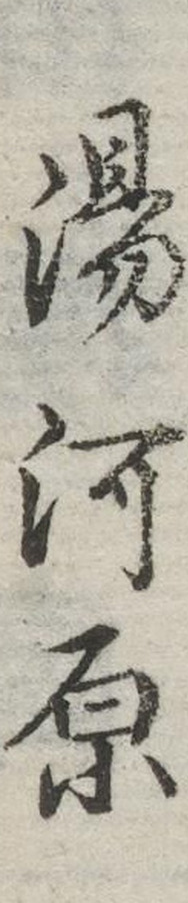湯河原

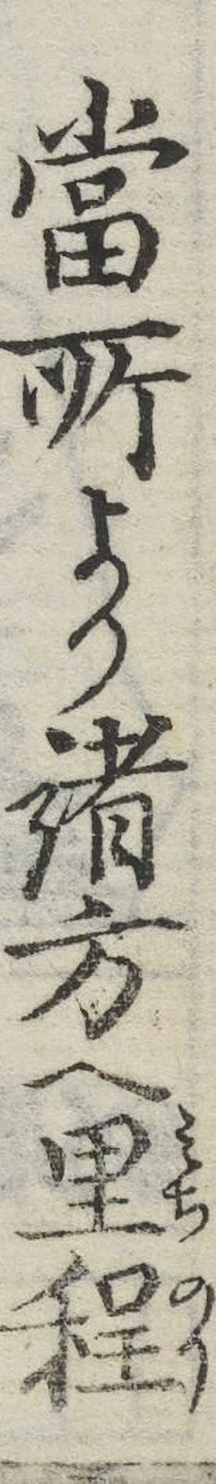当所より諸方へ里程
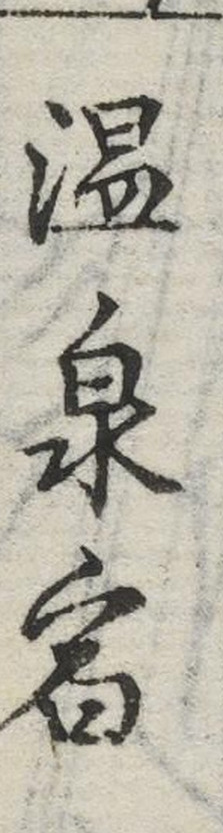温泉宿
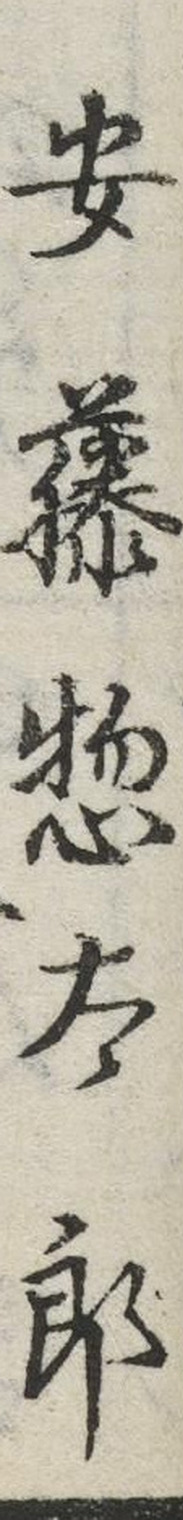安藤惣太郎
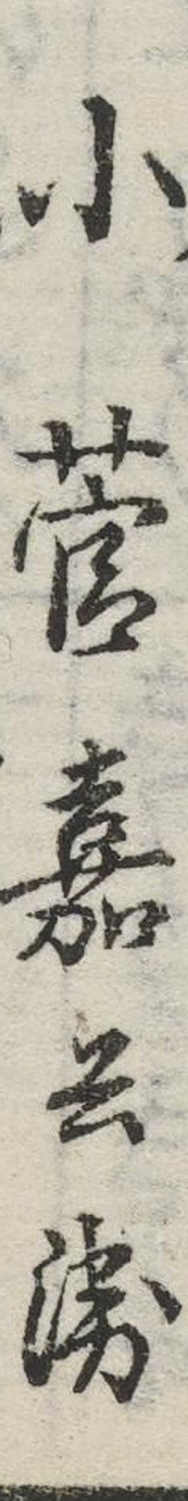小菅嘉兵衛
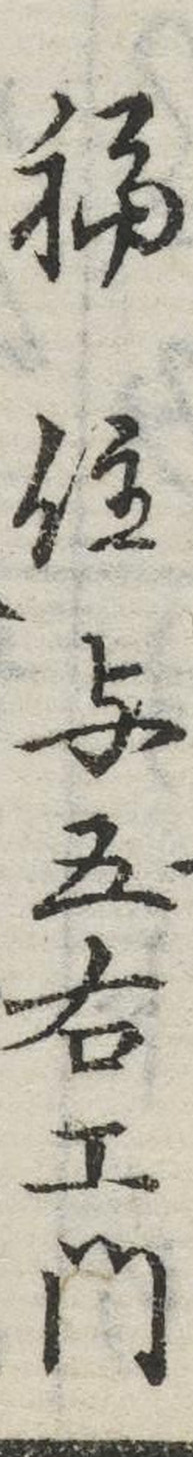福住与五右エ門
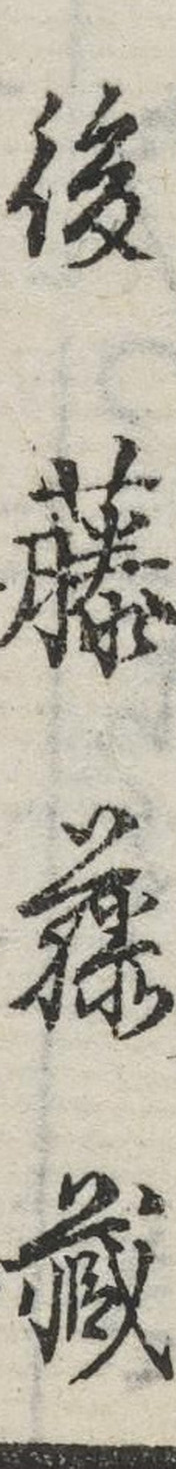後藤藤蔵
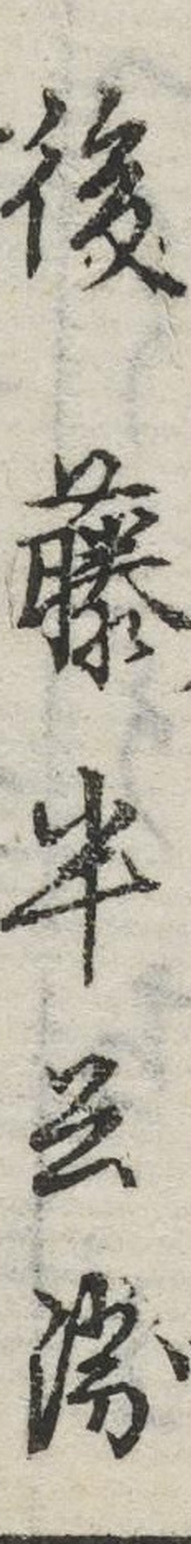後藤半兵衛
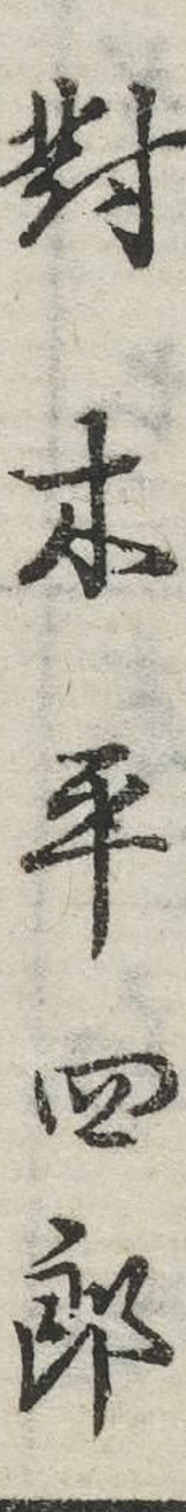對木平四郎
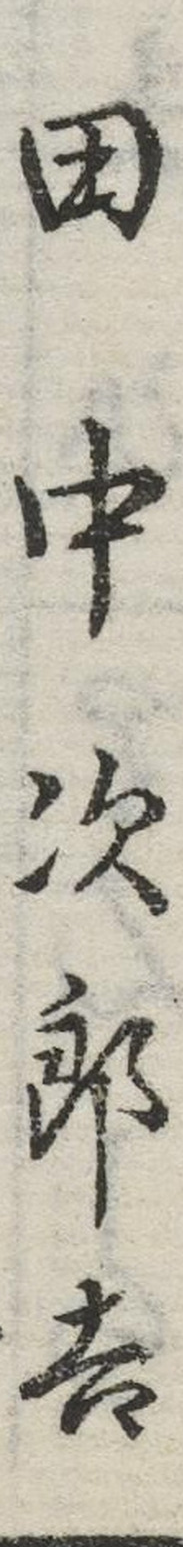田中次郎吉
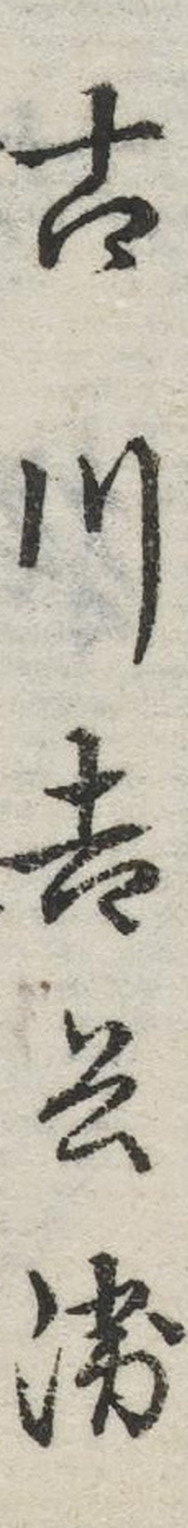古川吉兵衛
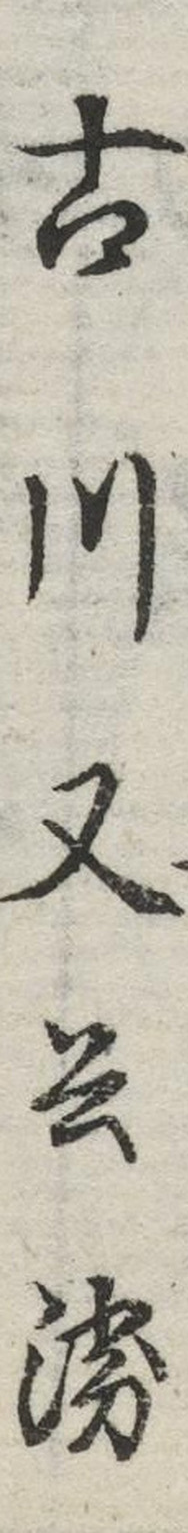古川又兵衛
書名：諸國温泉遊覽記　全
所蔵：東京大学地震研究所図書室 Earthquake Research Institute Library, The University of Tokyo, JAPAN
